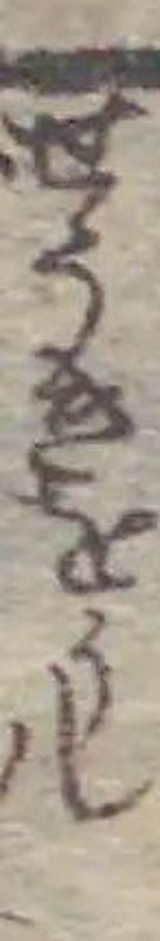せうきをうし
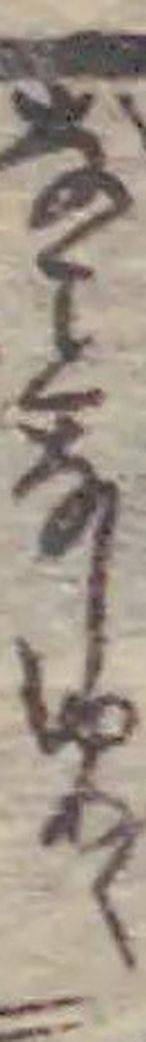なことなしゆめ〳〵
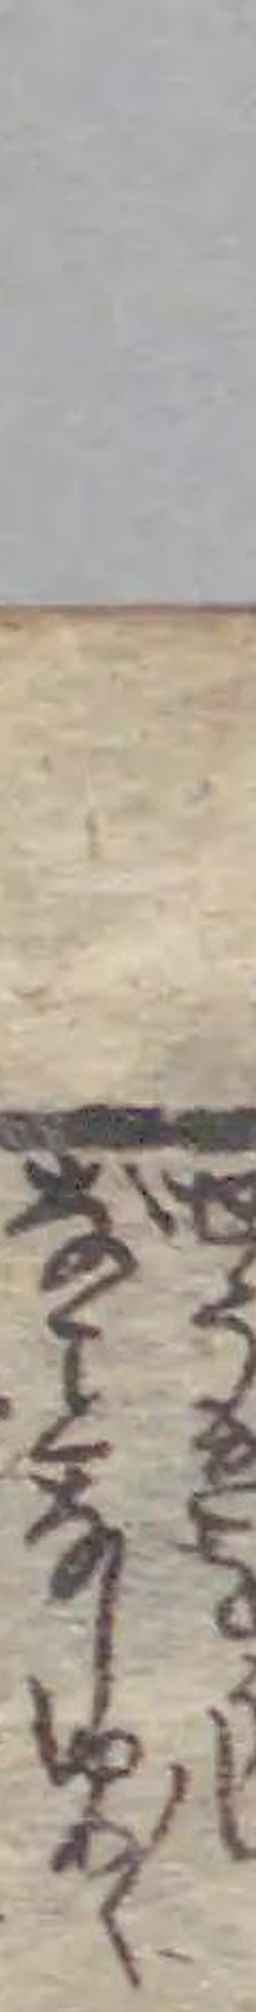なことなしゆめ〳〵
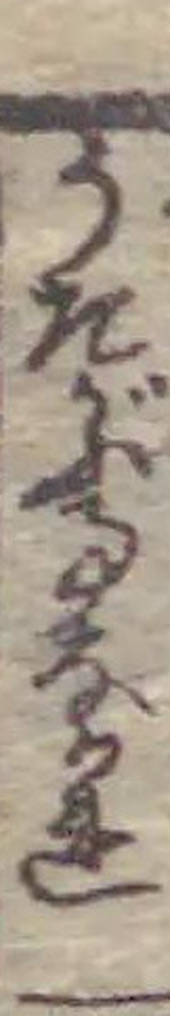うたがふ事なかれ

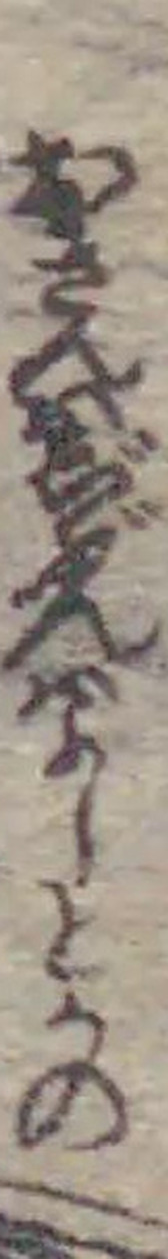おさんはじぶんはよしとかの
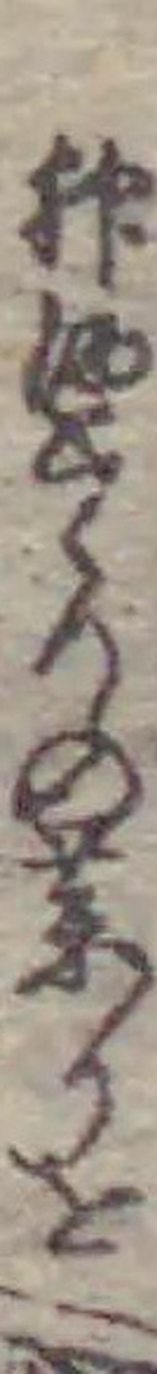神酒とくりの薬りを
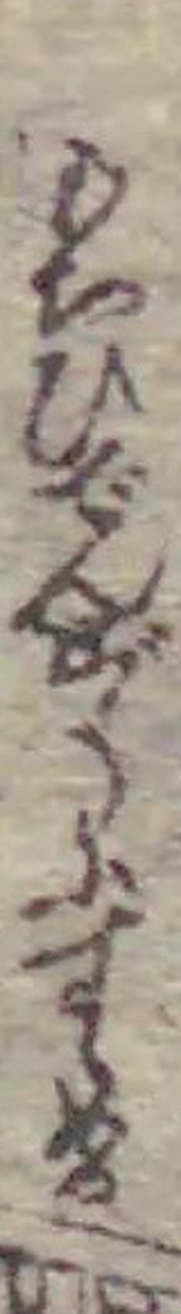もちひでんどうにすゝめる
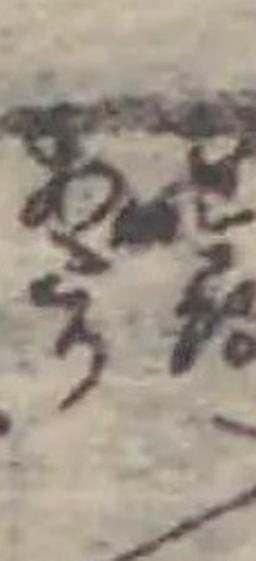あたり
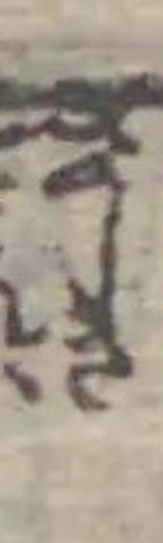さしき
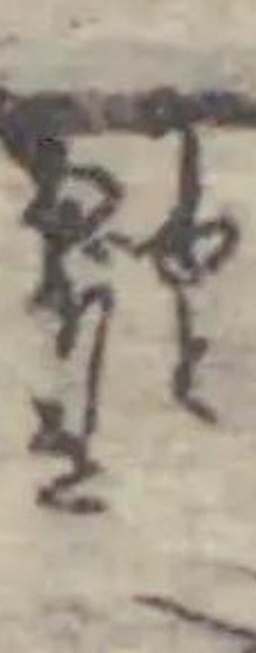おぼしき
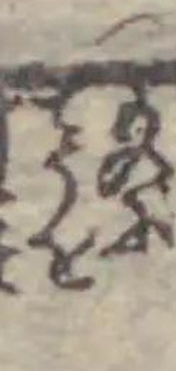ものに
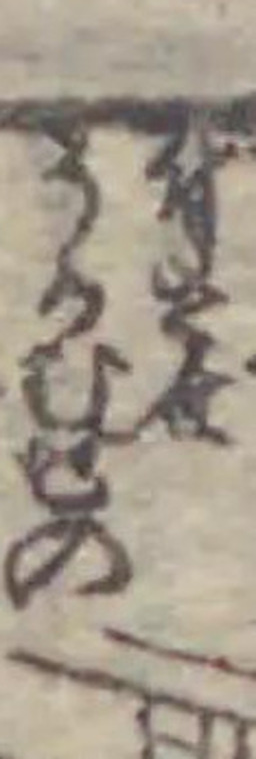うつむせの
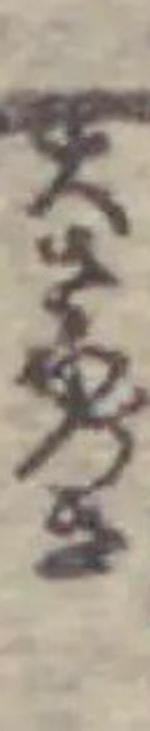大さかづき
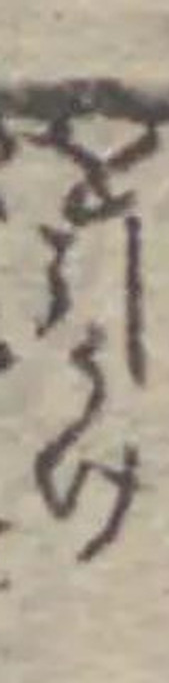を引うけ
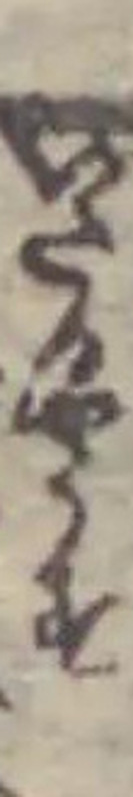いたるやうす
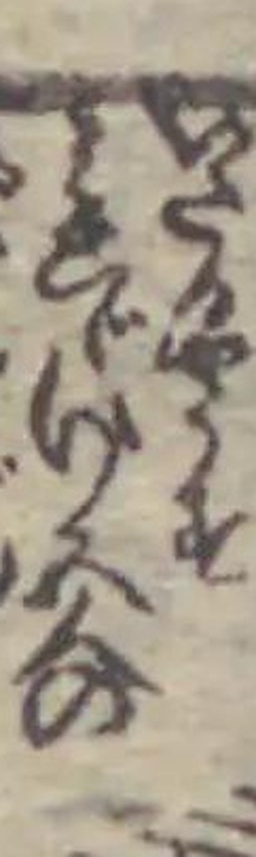みとゞけ五人の
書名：藝者五人娘 2巻
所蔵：国立国会図書館 National Diet Library, JAPAN
